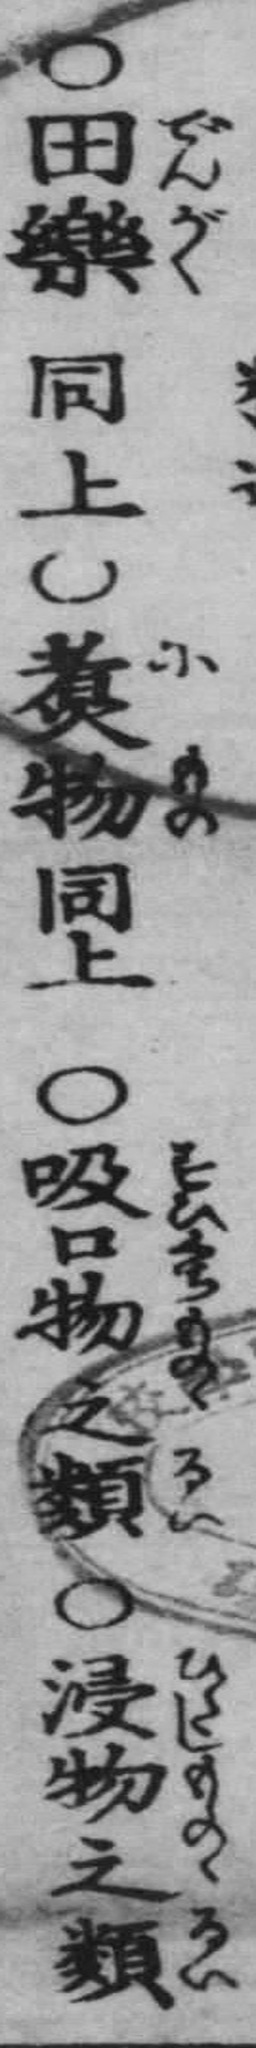〇田楽同上〇煮物同上〇吸口物之類〇浸物之類
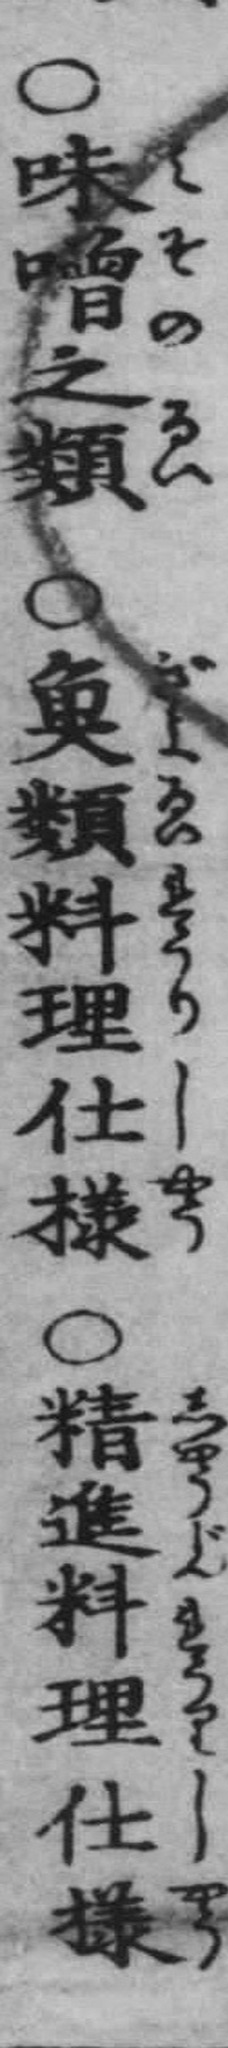〇味噌之類〇魚類料理仕様〇精進料理仕様
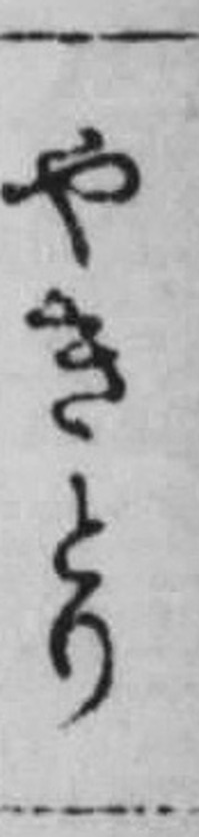やきとり
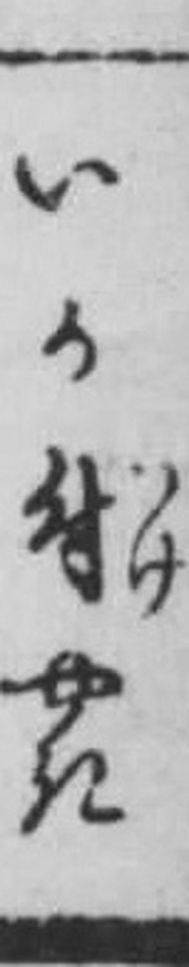いか付やき
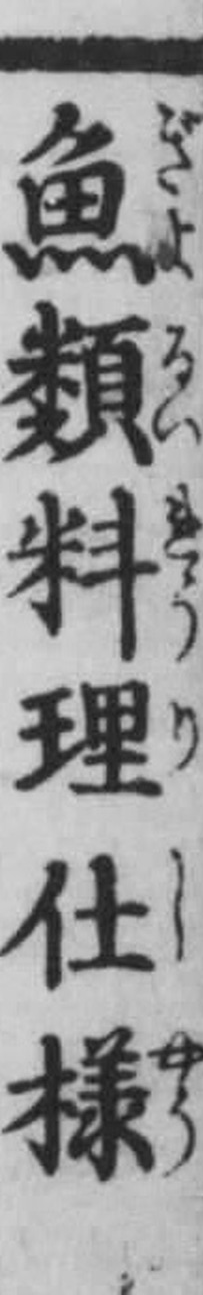魚類料理仕様
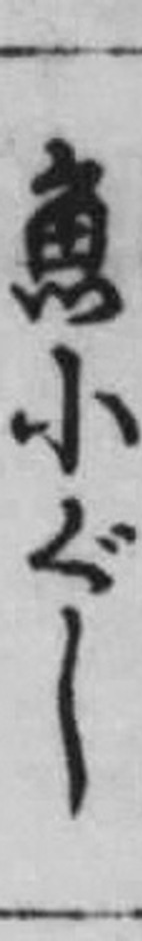魚小ぐし
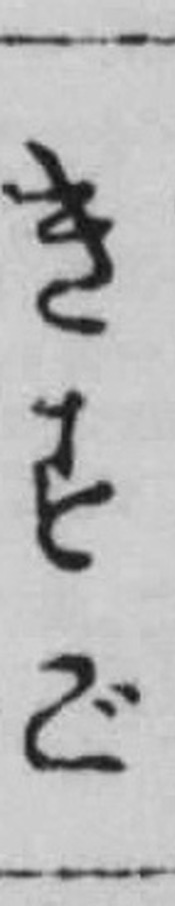きすご
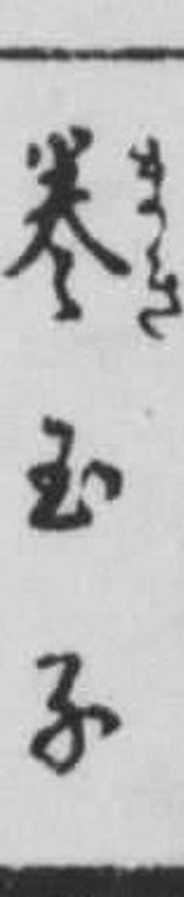巻玉子
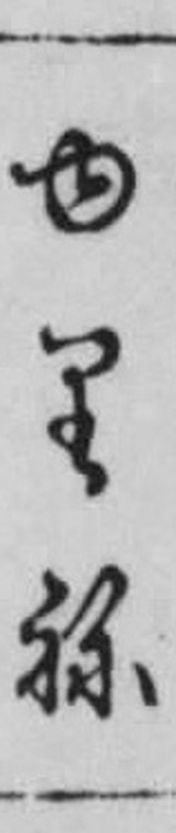ゆりね
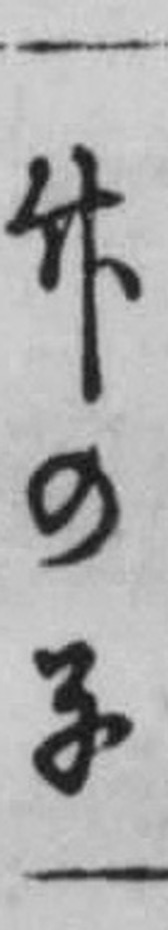竹の子
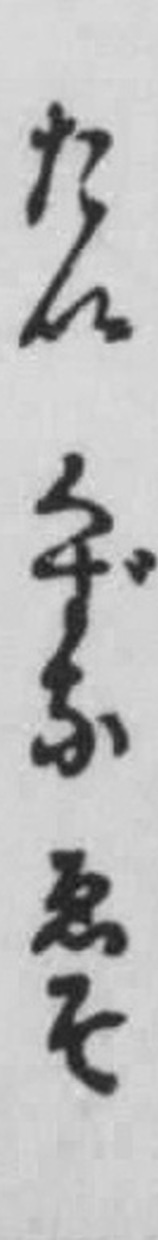たいくずなゑそ
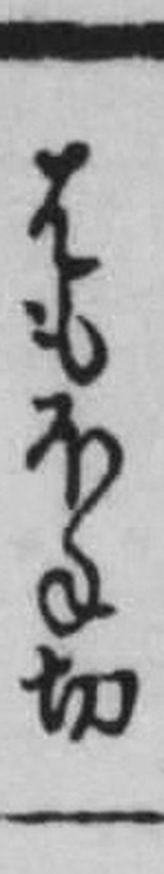はもほね切
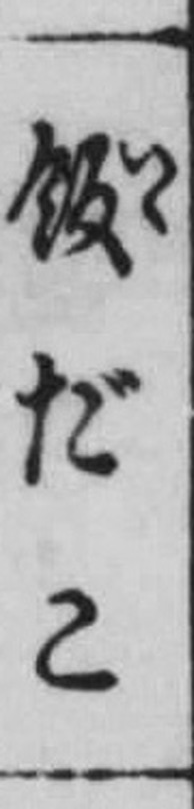飯だこ
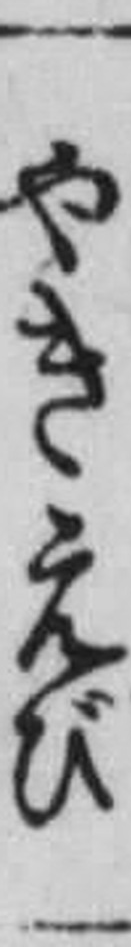やきえび
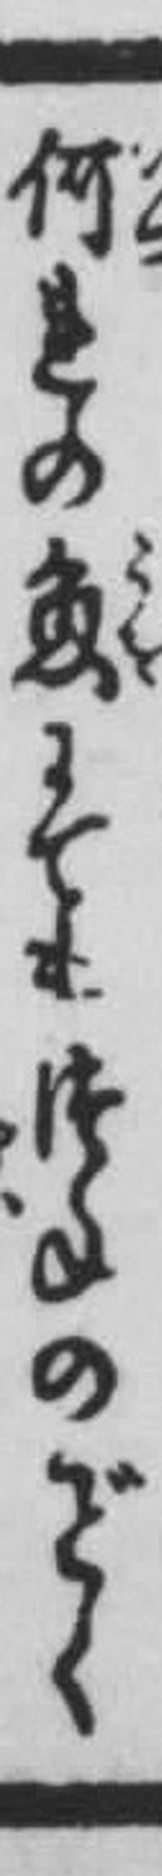何れの魚にてもつねのごとく
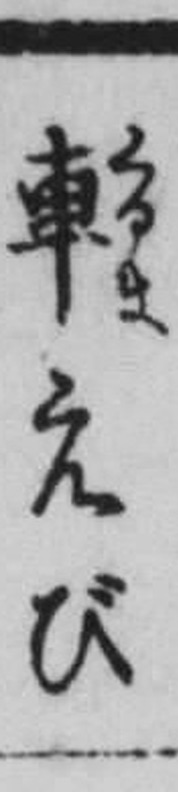車えび
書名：日用重宝魚類精進/料理早工風
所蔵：大阪府立大学学術情報センター 国文学研究資料館
